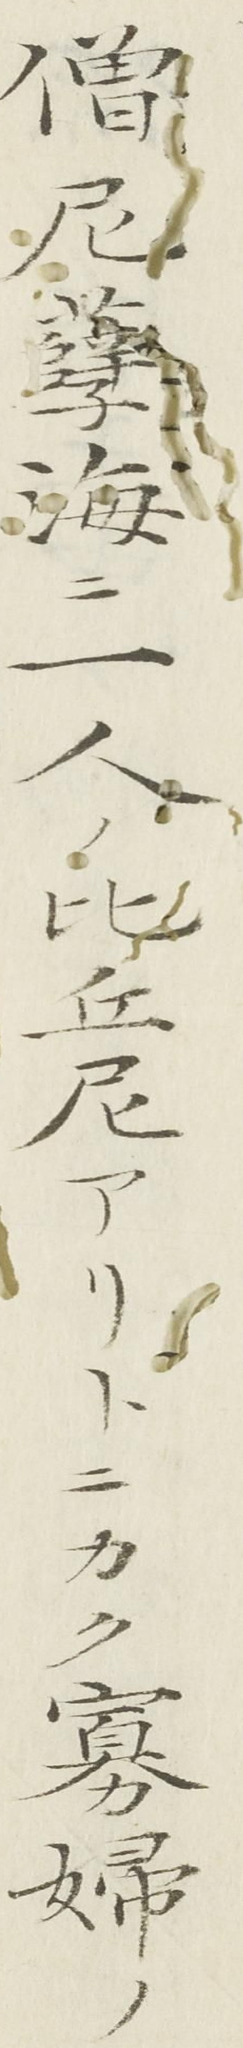僧尼海ニ一人比丘尼アリトニカク寡婦ノ
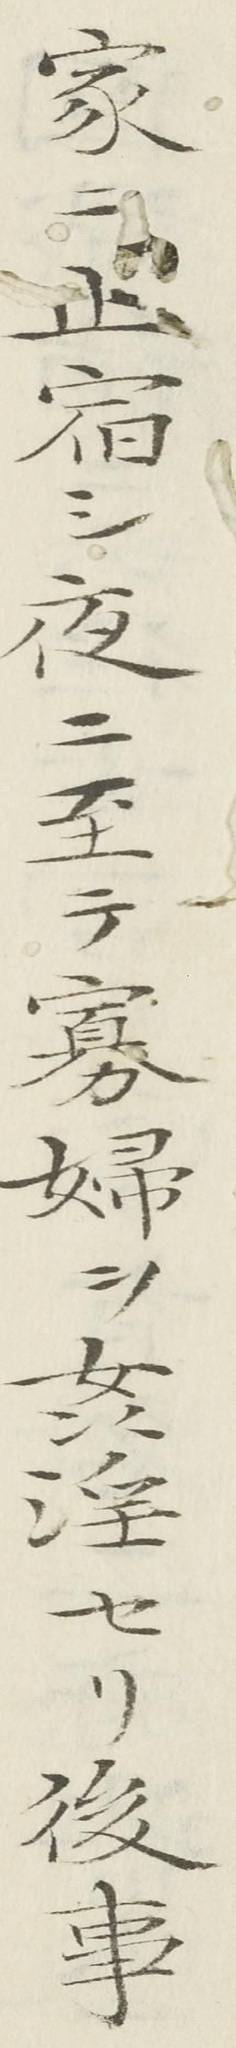家ニ止宿シ夜ニ至テ姦淫セリ後事
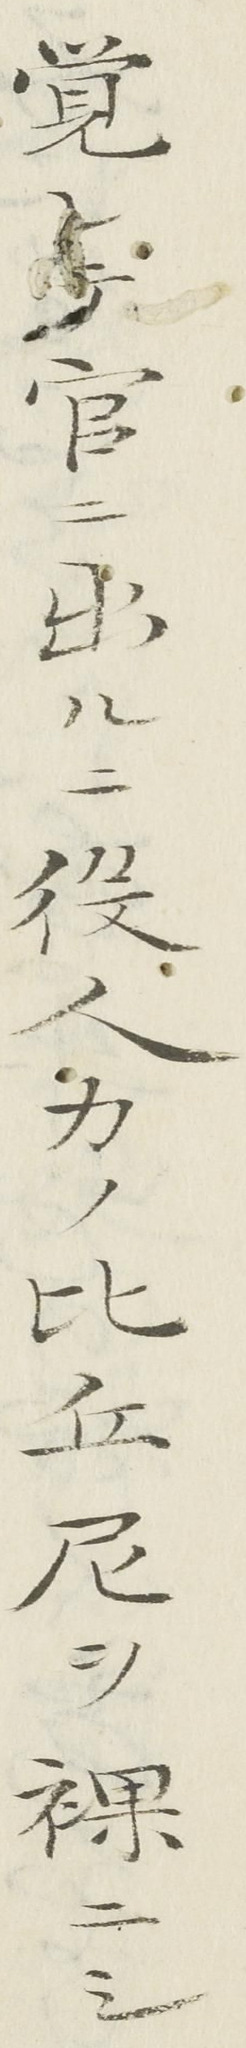覚ト？テ？官ニ出ルニ役人カノ比丘尼ヲ裸ニシ
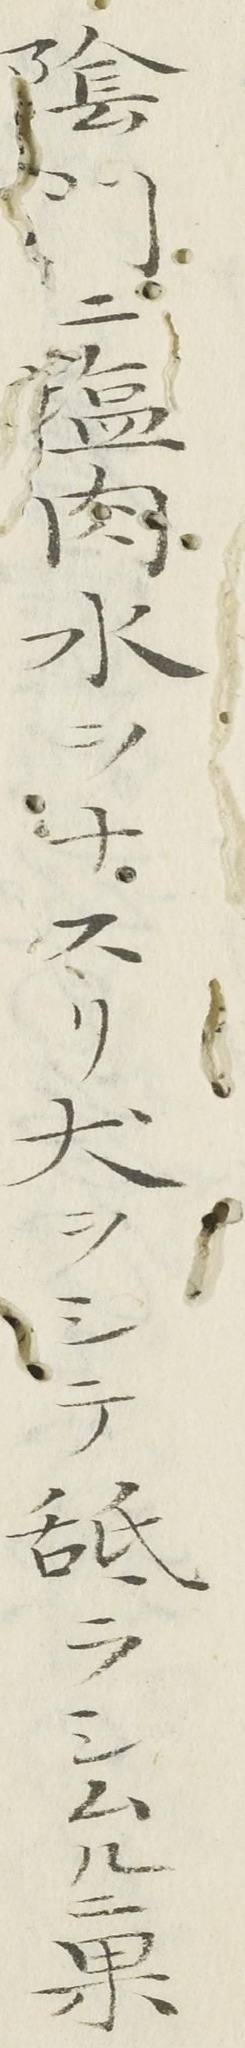陰門ニ塩肉水をナスリ犬ヲシテ舐ラシムルニ果
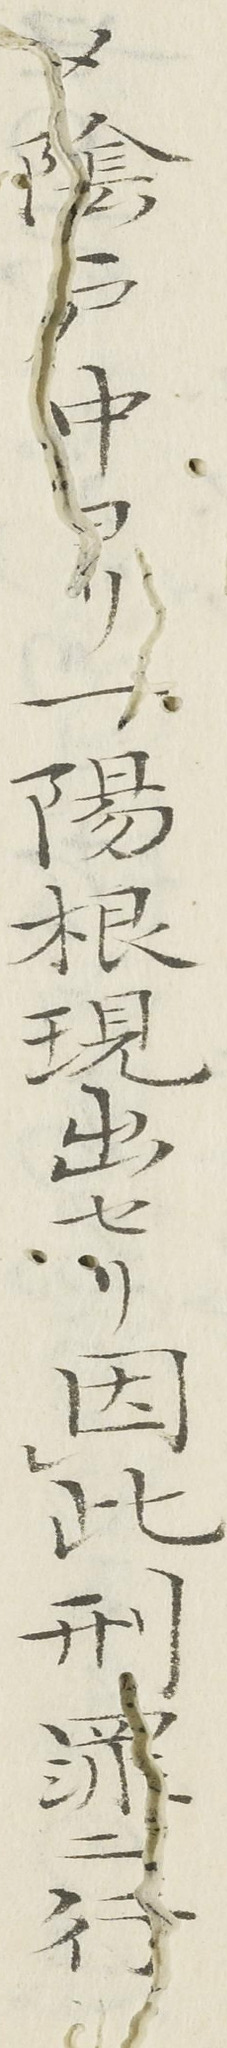〆陰戸中ヨリ一陽根現出せり因此刑罪ニ行
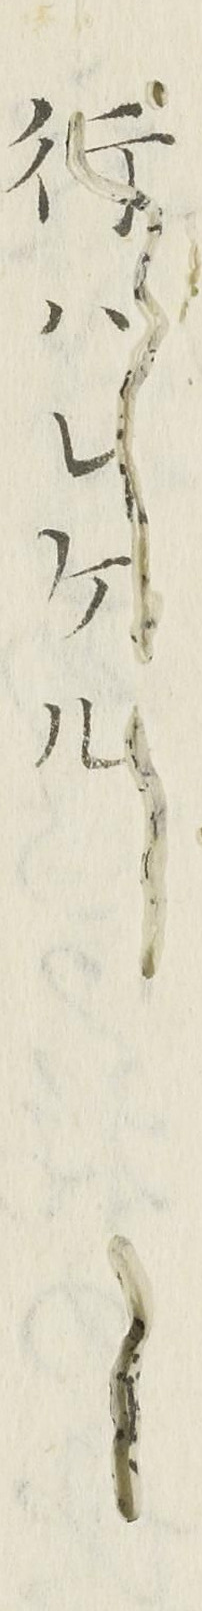行ハレケル
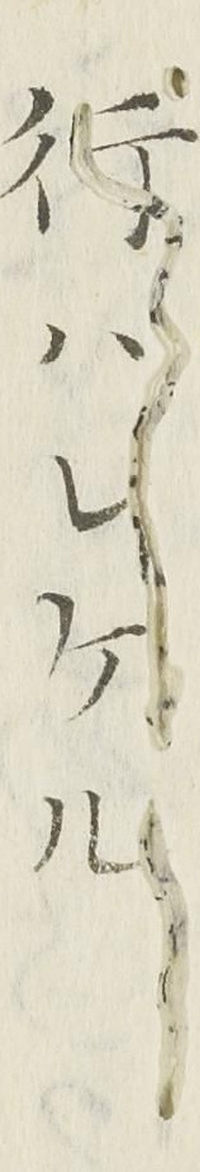行ハレケル
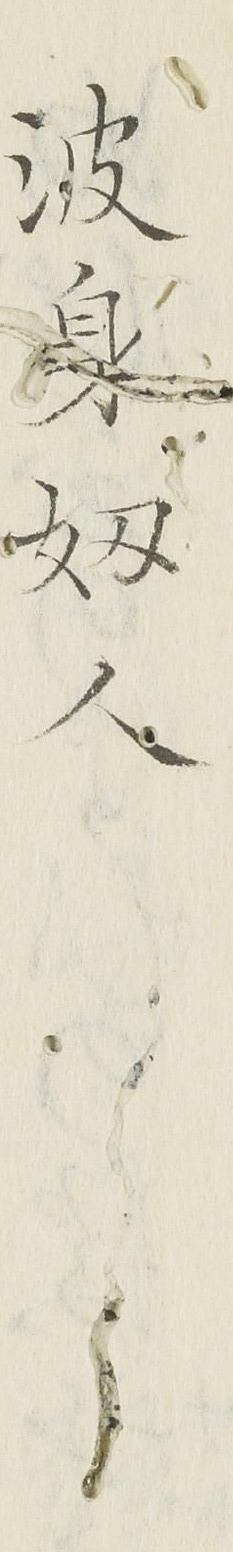波身奴人
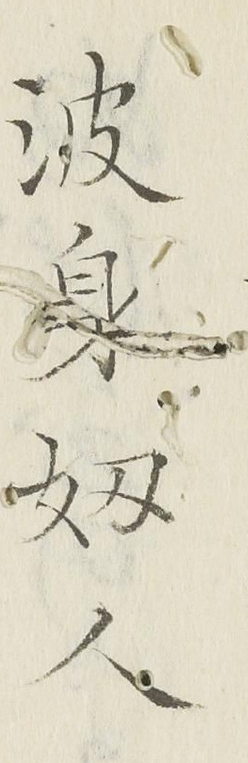波身奴人
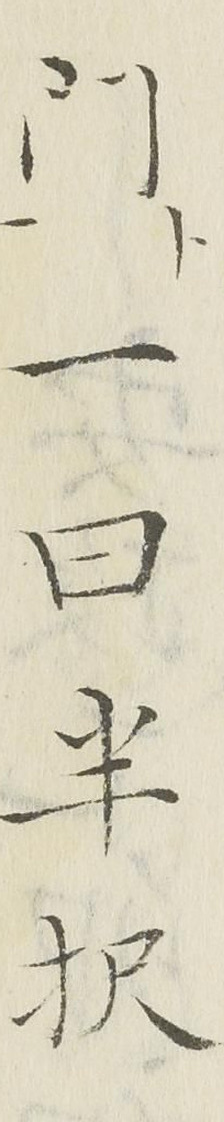門一日半択

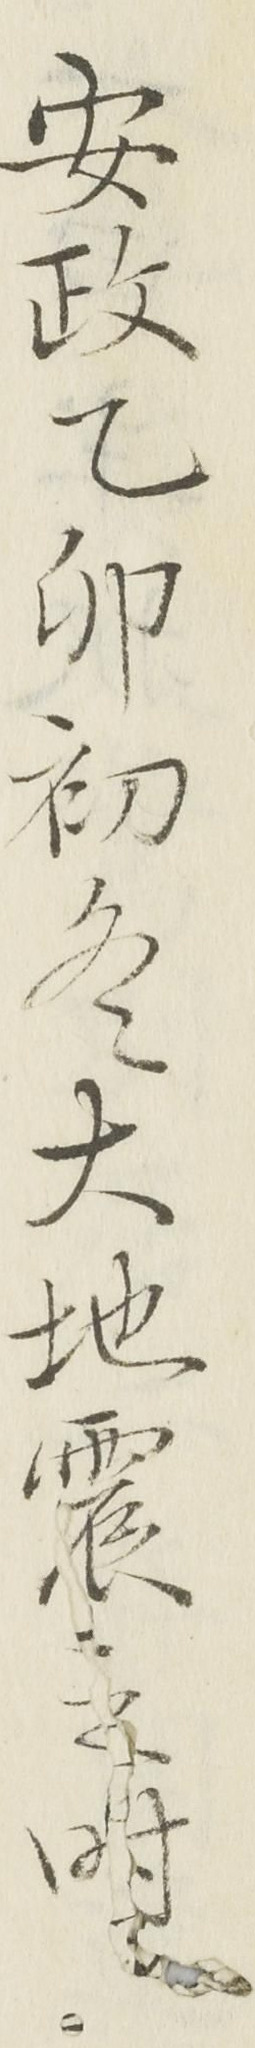安政乙卯初冬大地震之時
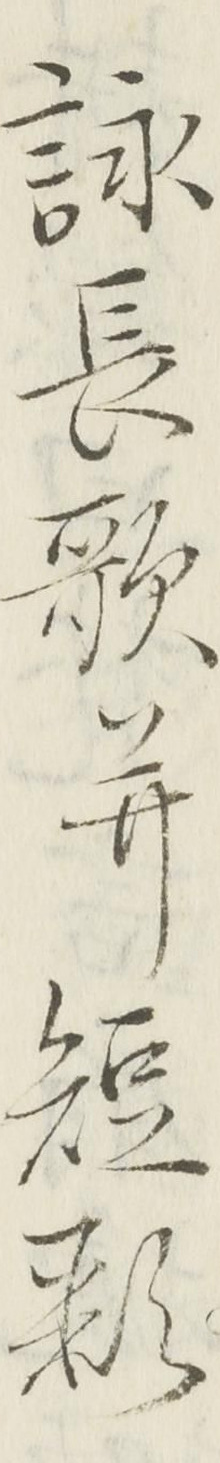詠長歌幷短歌
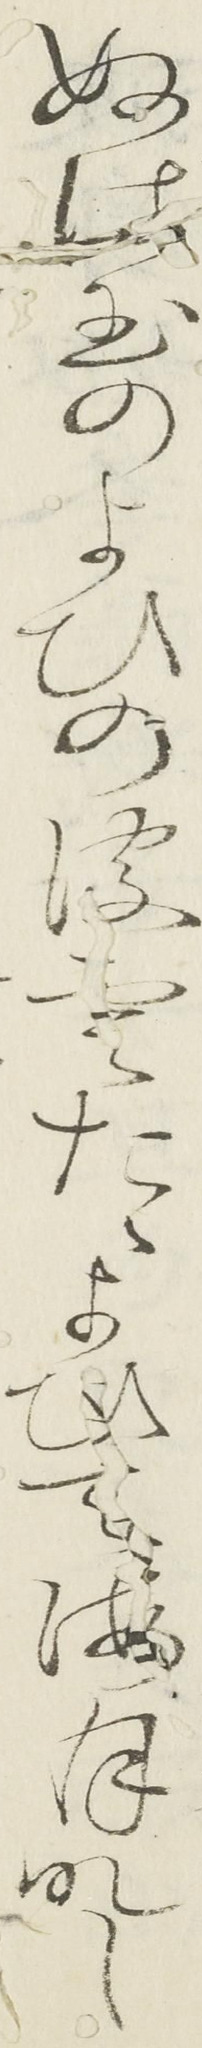ぬば玉のよひの波雲たゝよひて海月なし
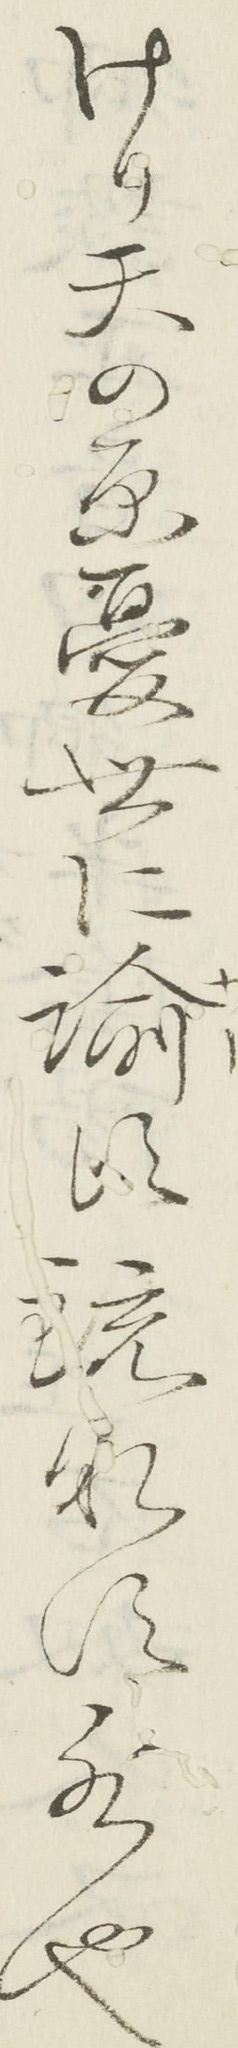けり天の原憂世に諭す競？朝？す水也
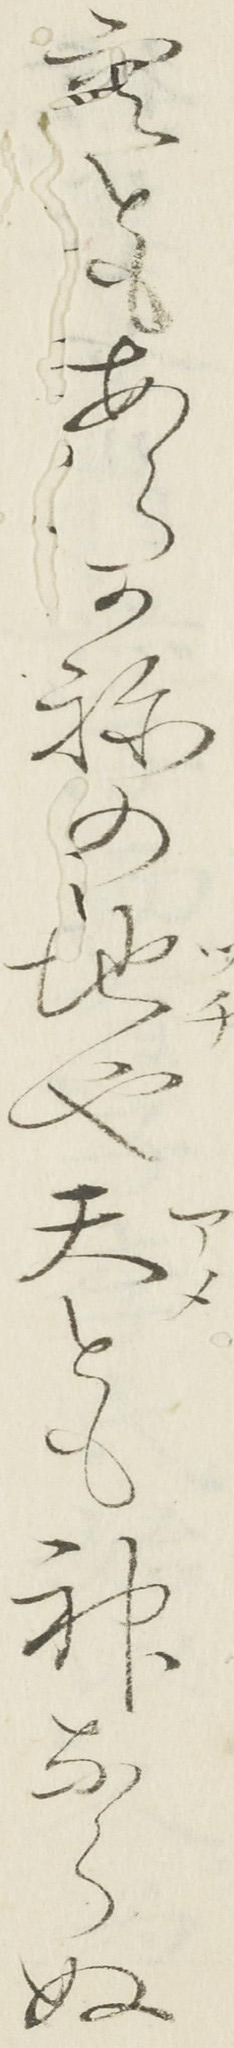雲ともあらかねの地や天とも神ならぬ
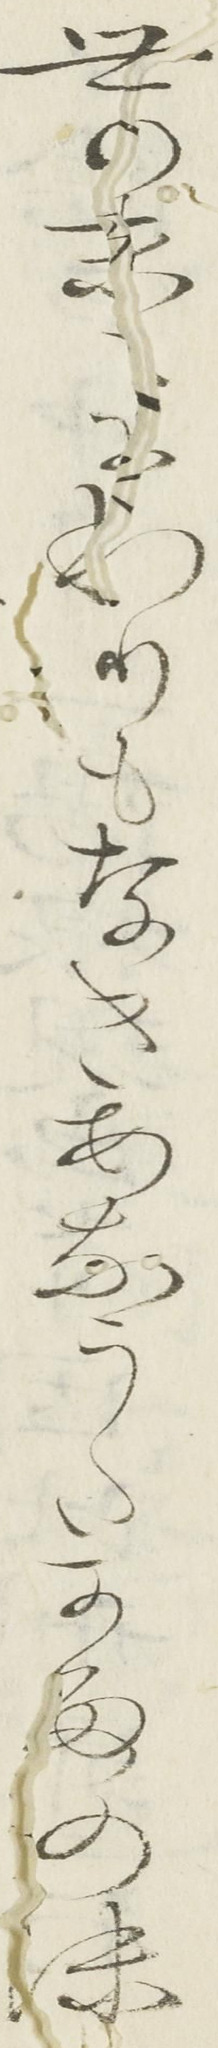世の来にわりもなきあなうたかたの沫
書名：地震考證　全
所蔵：東京大学地震研究所図書室 Earthquake Research Institute Library, The University of Tokyo, JAPAN
